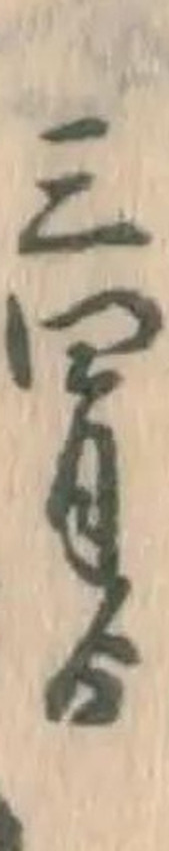三四月ゟ
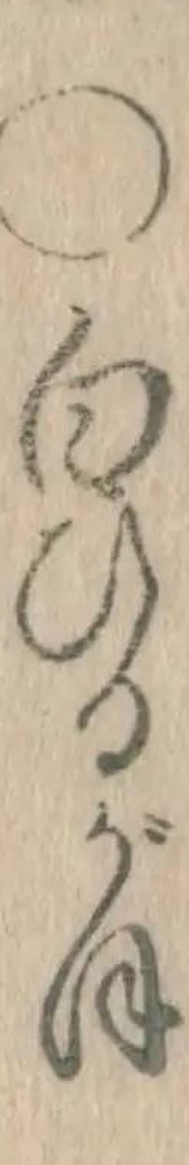〇白ひるがほ
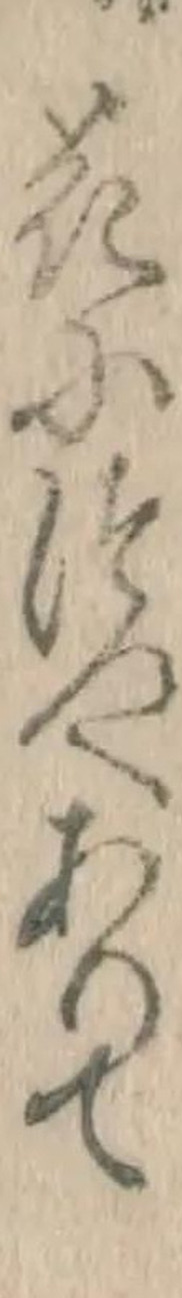花につたありて
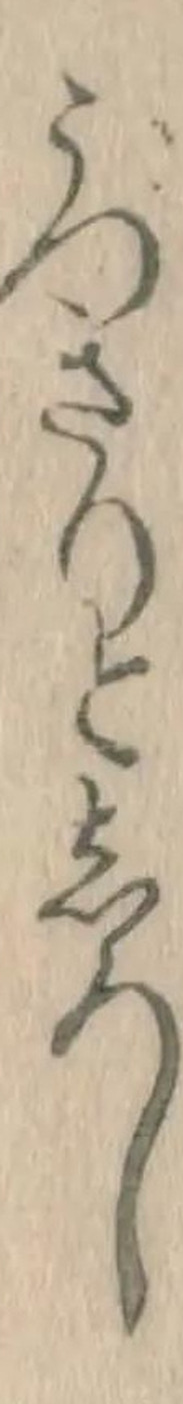うつきりとしろし
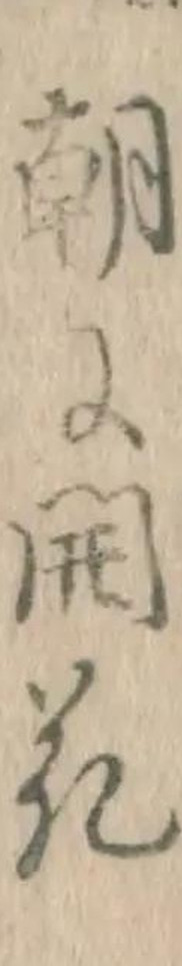朝に開花
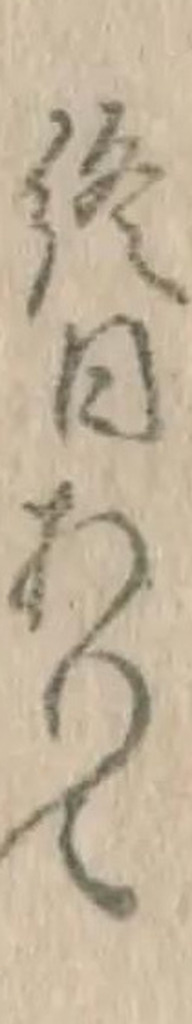終日ありて
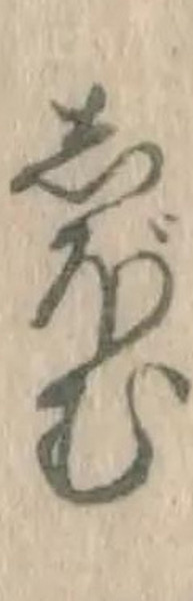しぼむ
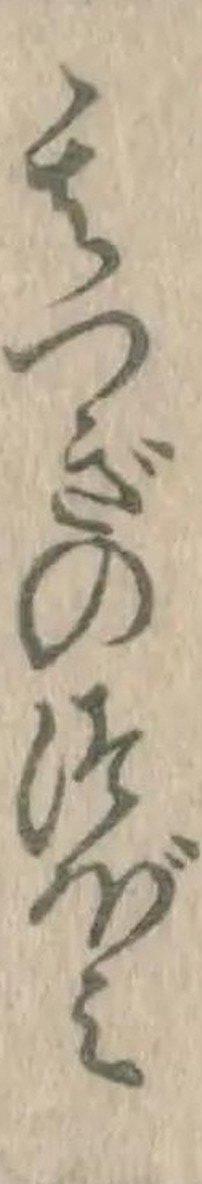其つぎのつぼみ
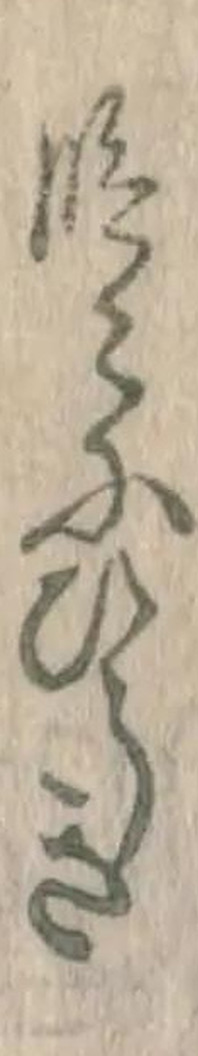段々にひらき
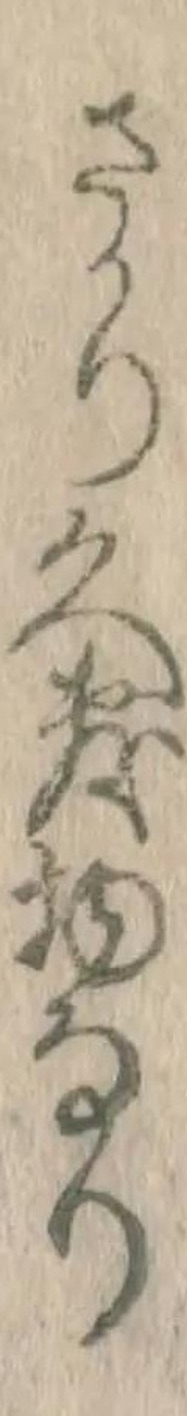さかり久敷物なり
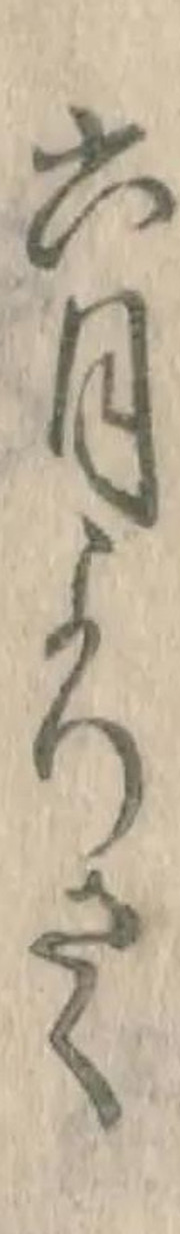六月よりさく
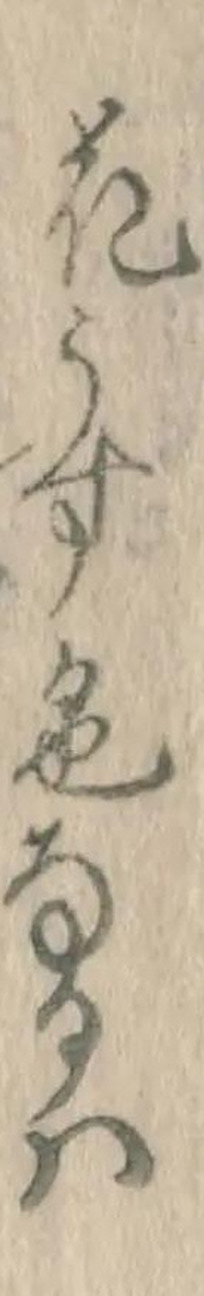花うす色なるは
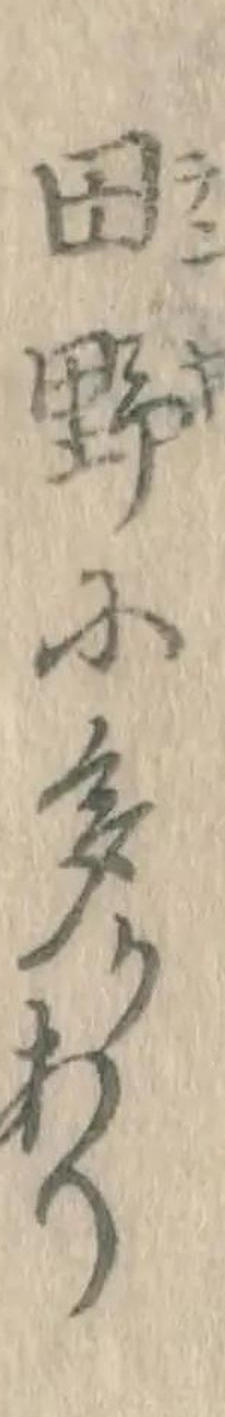田野に多くあり
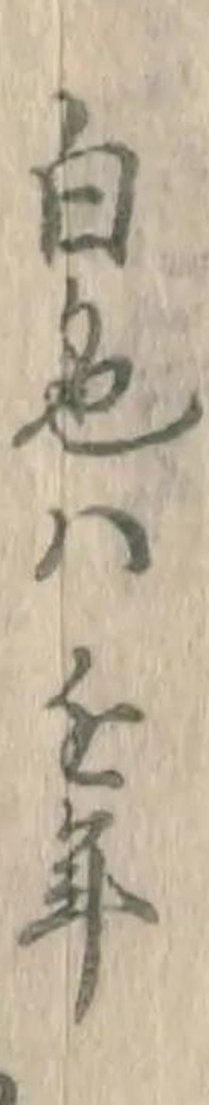白色は近年

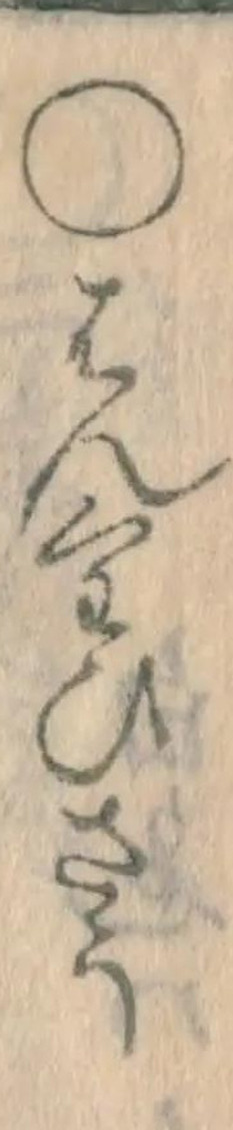〇はんくわひさう
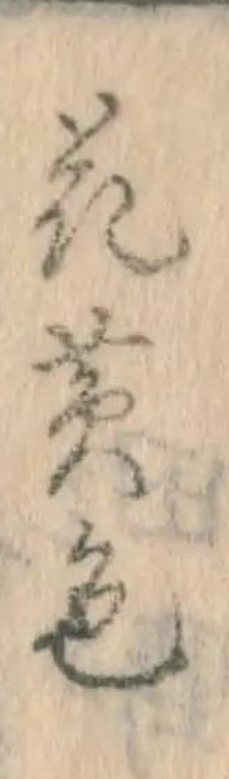花黄色
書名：艸花繪前集. [1]
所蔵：国立国会図書館 National Diet Library, JAPAN
